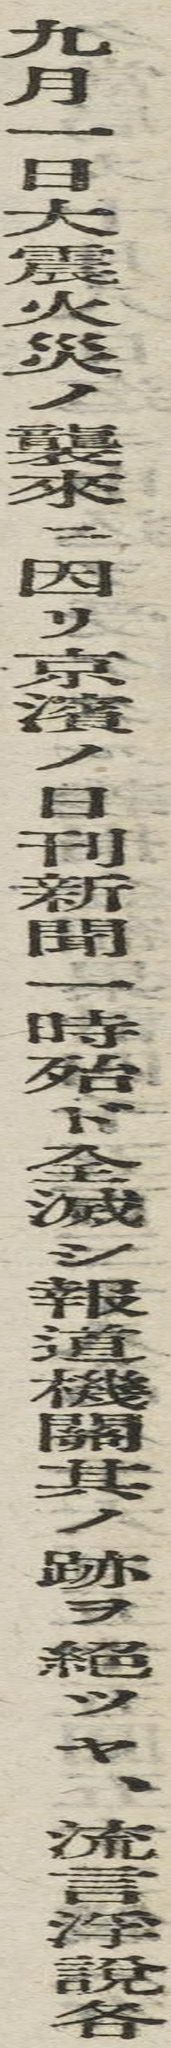九月一日大震火災ノ襲来ニ因リ京浜ノ日刊新聞一時殆ド全滅シ報道機関其ノ跡ヲ絶ツヤ、流言浮説各
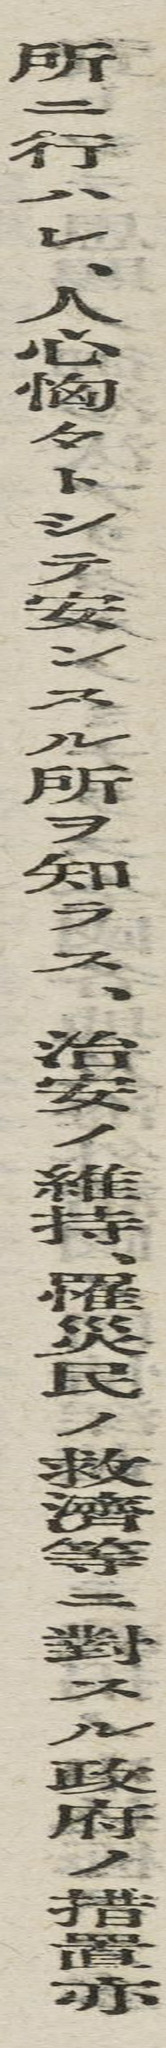所ニ行ハレ、人心恟々トシテ安ンスル所ヲ知ラス、治安ノ維持、罹災民ノ救済ニ対スル政府ノ措置亦
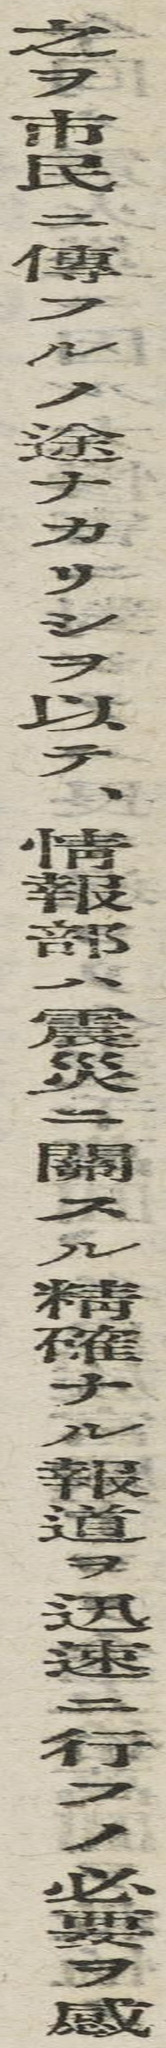之ヲ市民ニ伝フルノ途ナカリシヲ以テ、情報部ハ震災ニ関スル精確ナル報道ヲ迅速ニ行フノ必要ヲ感
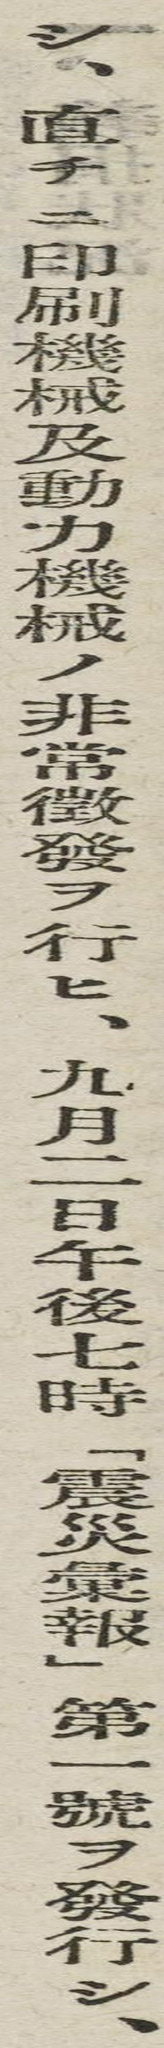シ、直チニ印刷機械及動力機械ノ非常徴発ヲ行ヒ、九月二日午後七時「震災実報」第一号ヲ発行シ、
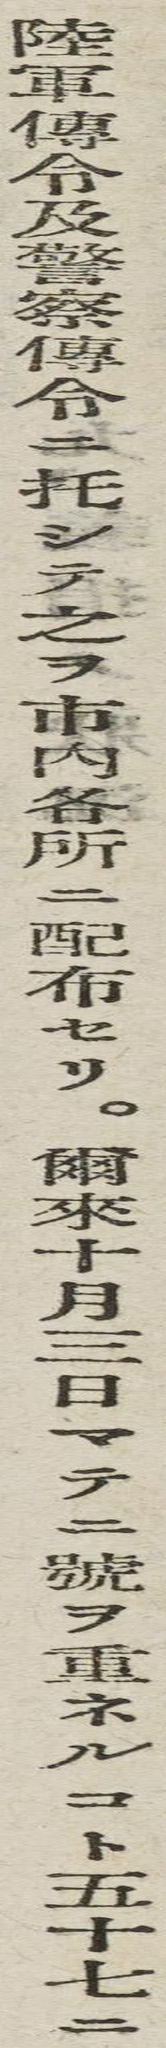陸軍伝令及警察伝令ニ托シテ之ヲ市内各所ニ配布セリ。爾来十月三日マテニ号ヲ重ネルコト五十七ニ
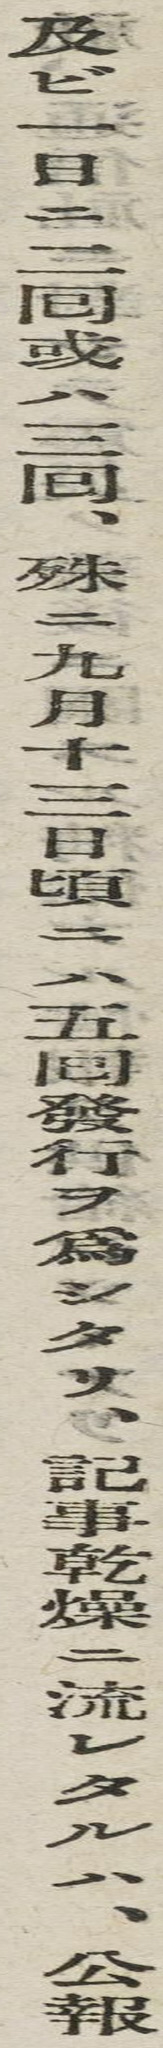及ビ一日ニ二回或ハ三回、殊ニ九月十三日頃ニハ五回発行ヲ為シタリ、記事乾燥ニ流レタルハ、広報
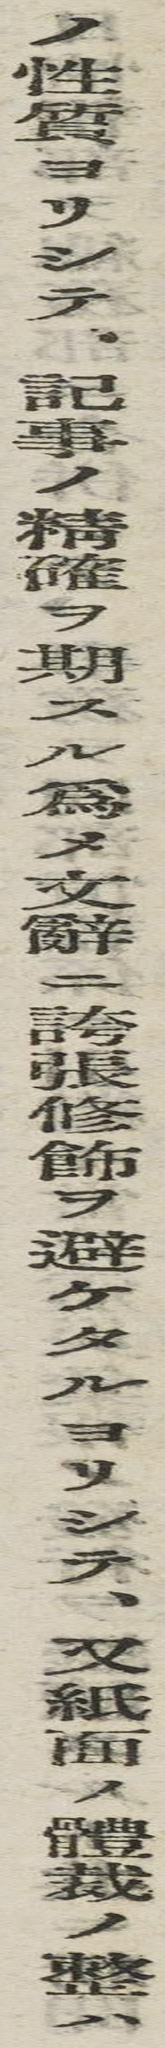ノ性質ヨリシテ、記事ノ精確ヲ期スル為メ文辭ニ誇張修飾ヲ避ケタルヨリシテ、又紙面ノ体裁ノ整ハ
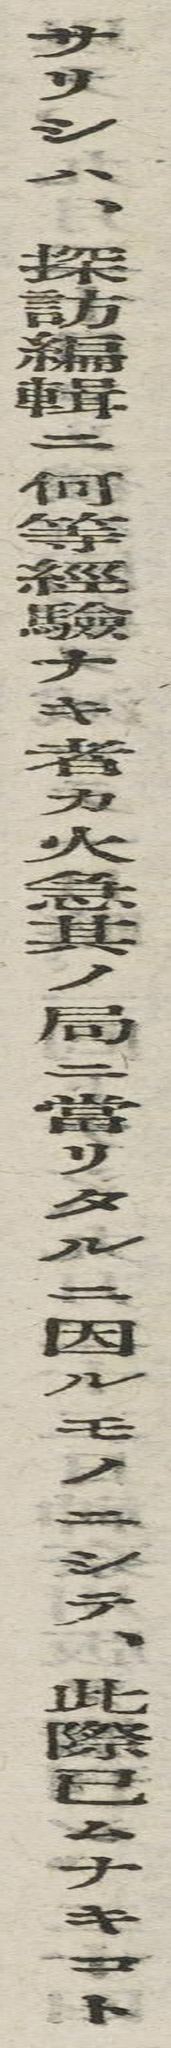サリシハ、探訪遍輯ニ何等経験ナキ者カ火急其ノ局ニ当リタルニ因ルモノニシテ、此際已ムナキコト
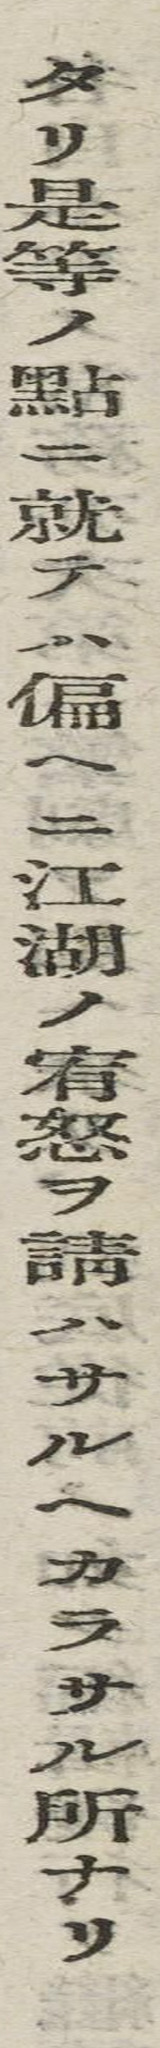タリ是等ノ点ニ就テハ偏ニ江湖ノ宥怒ヲ請ハサルヘカラサル所ナリ
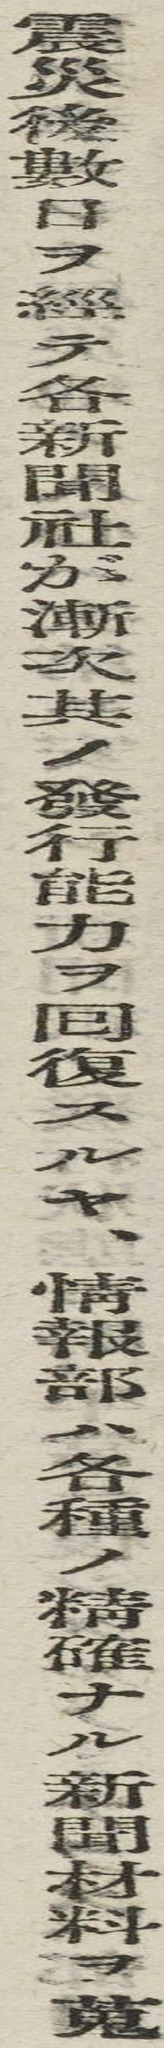震災後数日ヲ経テ各新聞社が漸次其ノ発行能力ヲ回復スルヤ、情報部ハ各種ノ精確ナル新聞材料を蒐
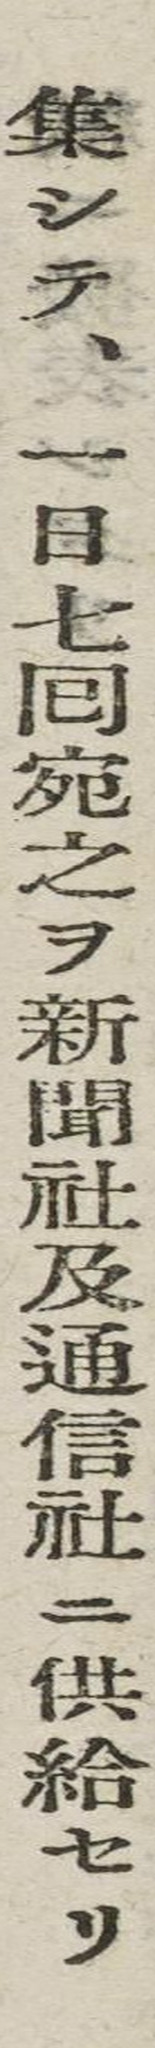集シテ、一日七回宛之ヲ新聞社及通信社ニ供給セリ
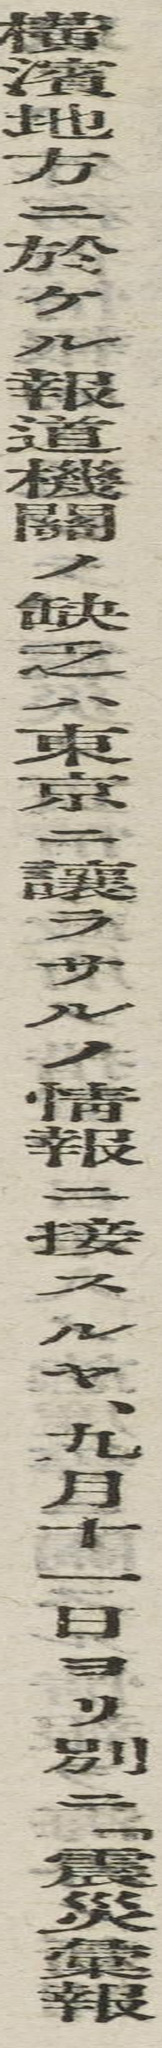横浜地方ニ於ケル報道機関ノ欠乏ハ東京ニ譲ラサルノ情報ニ接スルヤ、九月十一日ヨリ別ニ「震災実報
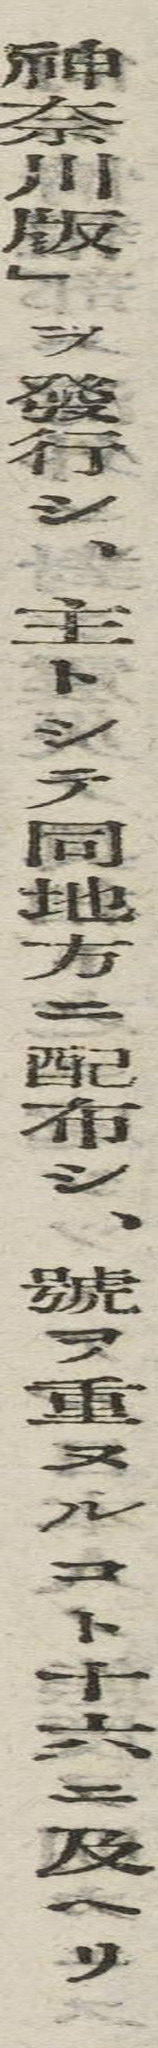神奈川県版」ヲ発行シ、主トシテ同地方ニ配布シ、号ヲ重ヌルコト十六ニ及ヘリ

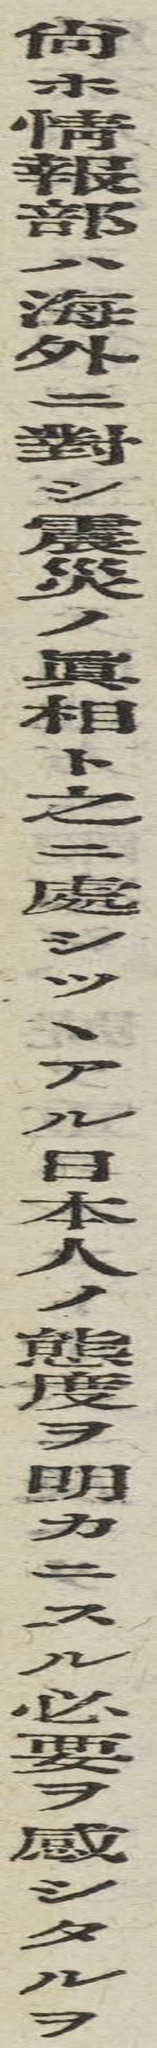尚ホ情報部ハ海外ニ対シ震災ノ真相ト之ニ処シツヽアル日本人ノ態度ヲ明カニスル必要ヲ感シタルヲ
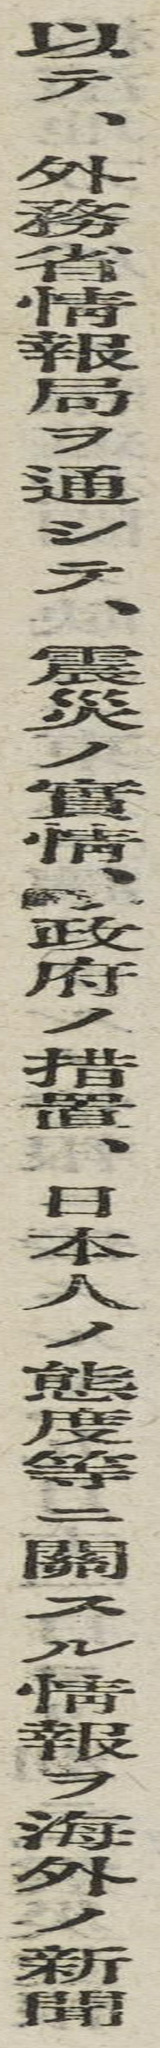以テ、外務省情報局ヲ通シテ、震災ノ実情、政府ノ措置、日本人ノ態度等ニ関スル情報ヲ海外ノ新聞
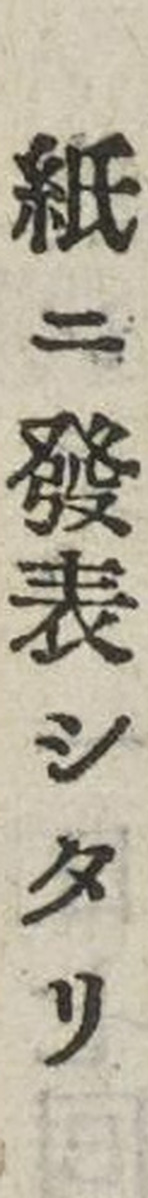紙ニ発表シタリ
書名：震災被害状況並救護施設概要
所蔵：東京大学地震研究所図書室 Earthquake Research Institute Library, The University of Tokyo, JAPAN
